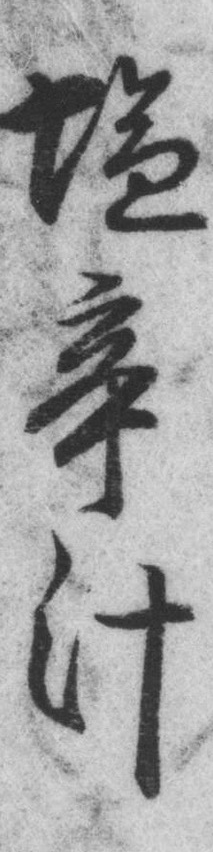塩辛汁
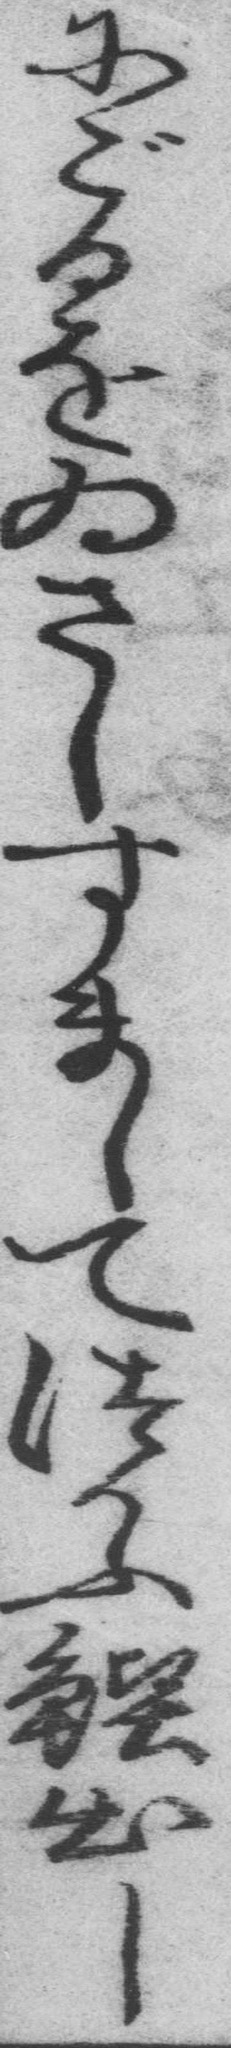にごるをゐさしすましてつかふ鰹出し
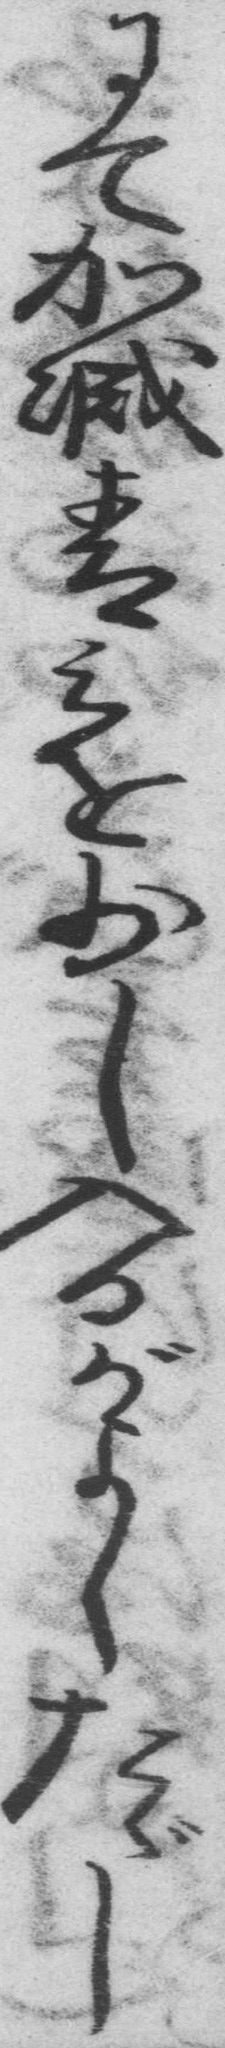にて加減麦みを少し入るがよしたゞし
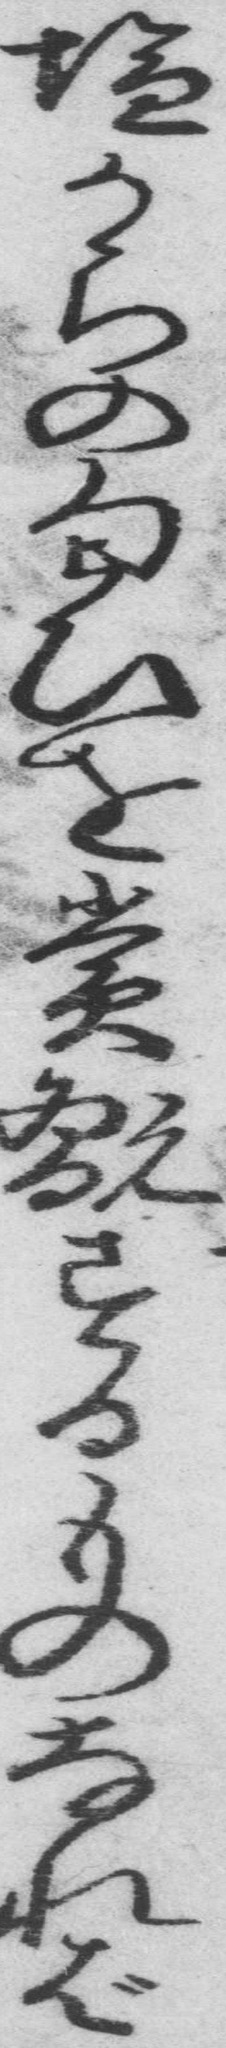塩からの匂ひを賞翫するものなれば
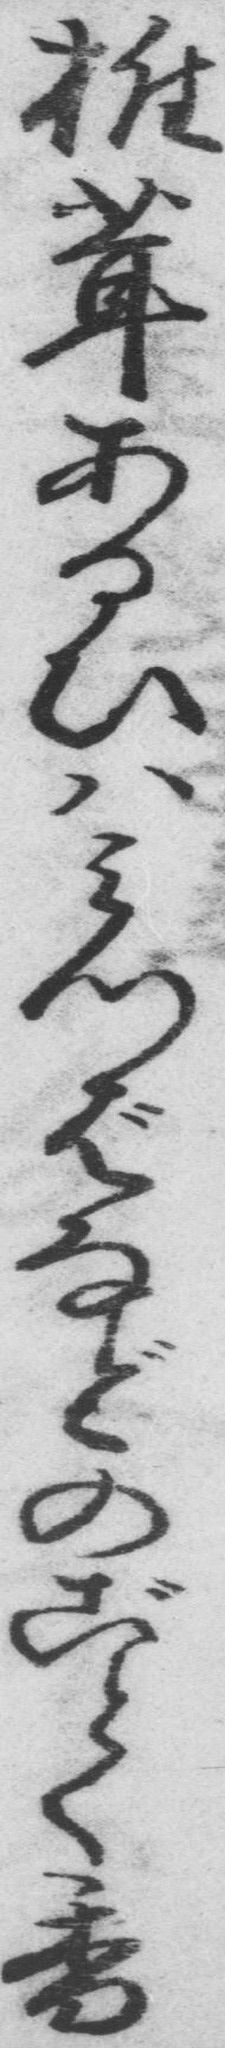椎茸あるひはみつばなどのごとく香
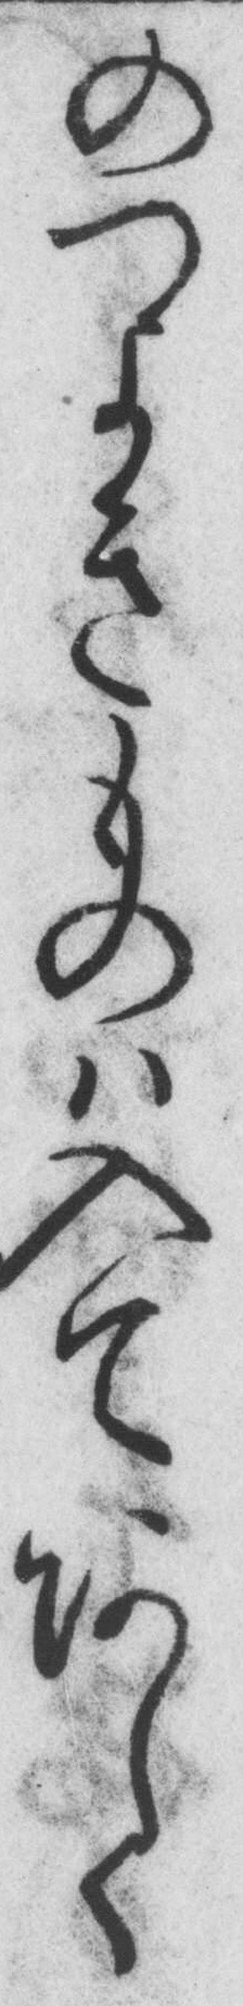のつよきものは入てあしく
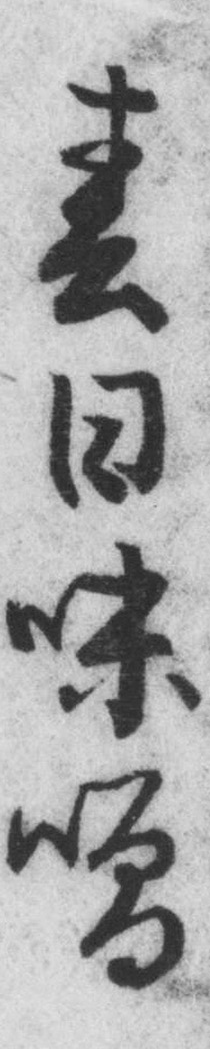春日味噌
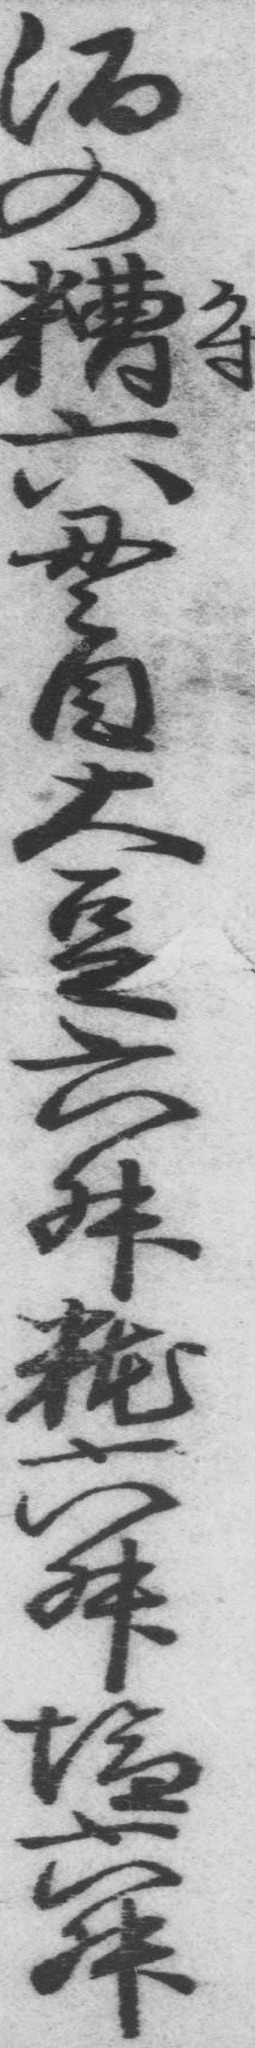酒の糟六貫目大豆六升糀六升塩六升
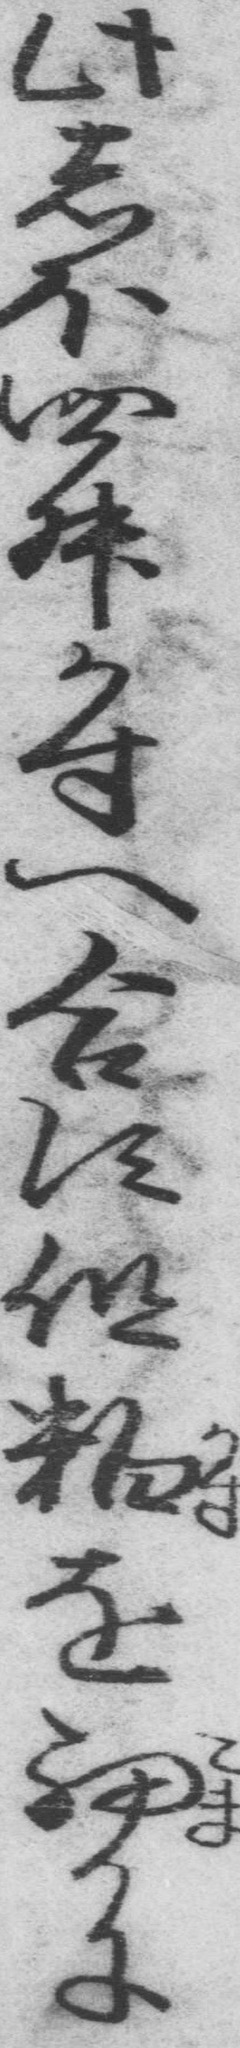此しほ四升かすへ合す但粕を細かに
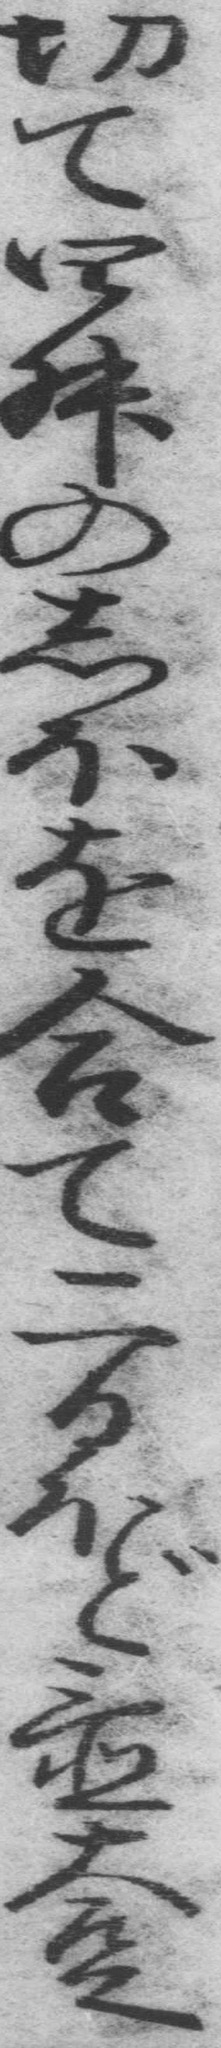切て四升のしほを合て二日ほど置大豆

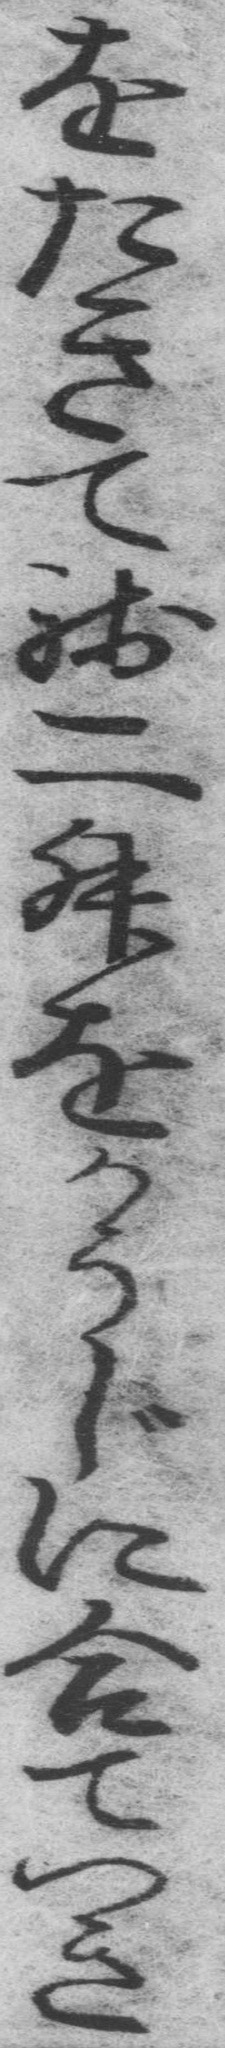をたきて残二升をかうじに合てつき
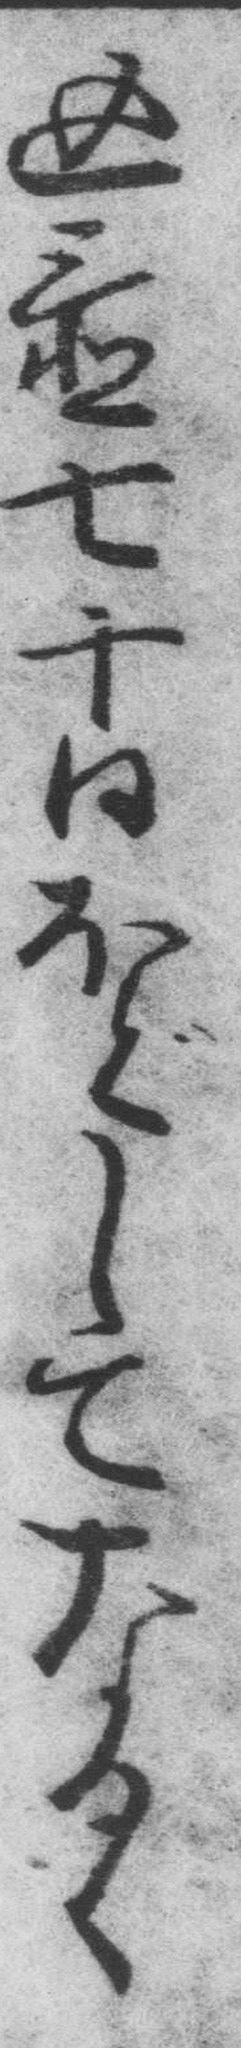込置七十日ほどしてなるゝ
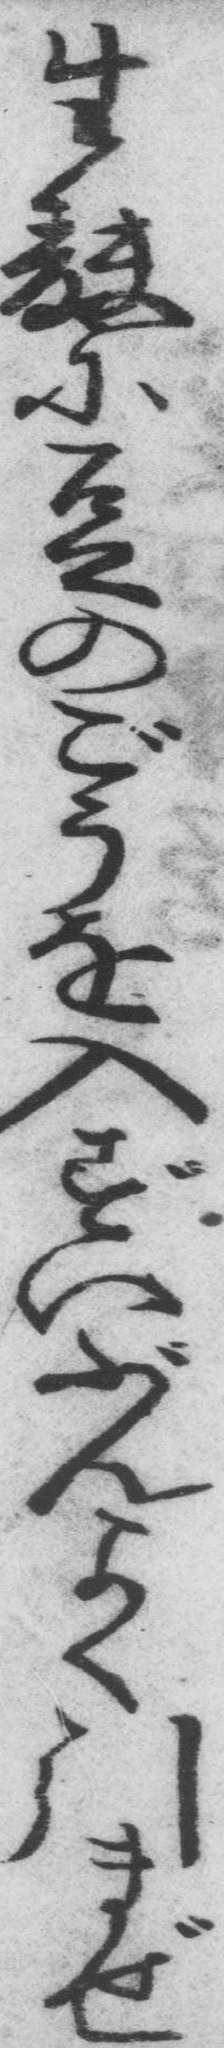生麩に豆のごうを入ずいぶんよく引まぜ
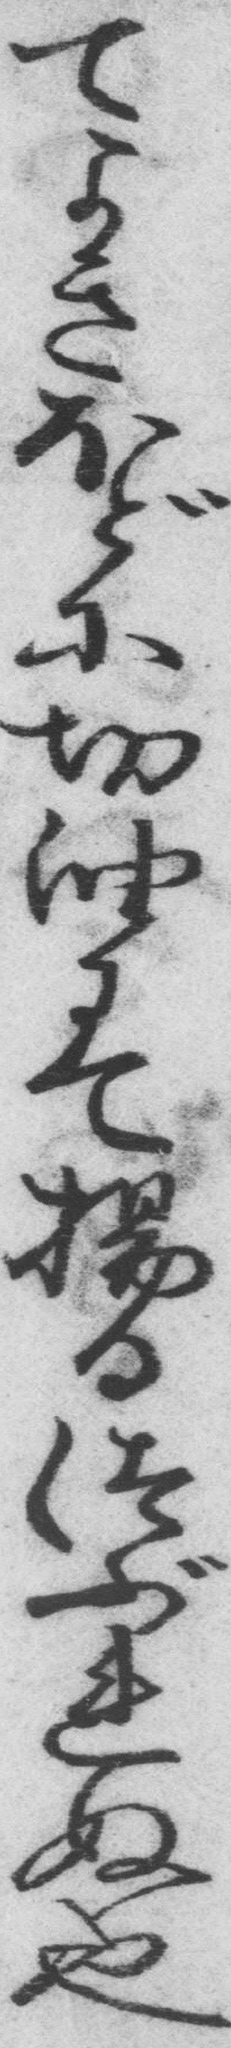てよきほどに切油にて揚るつぶれぬ也
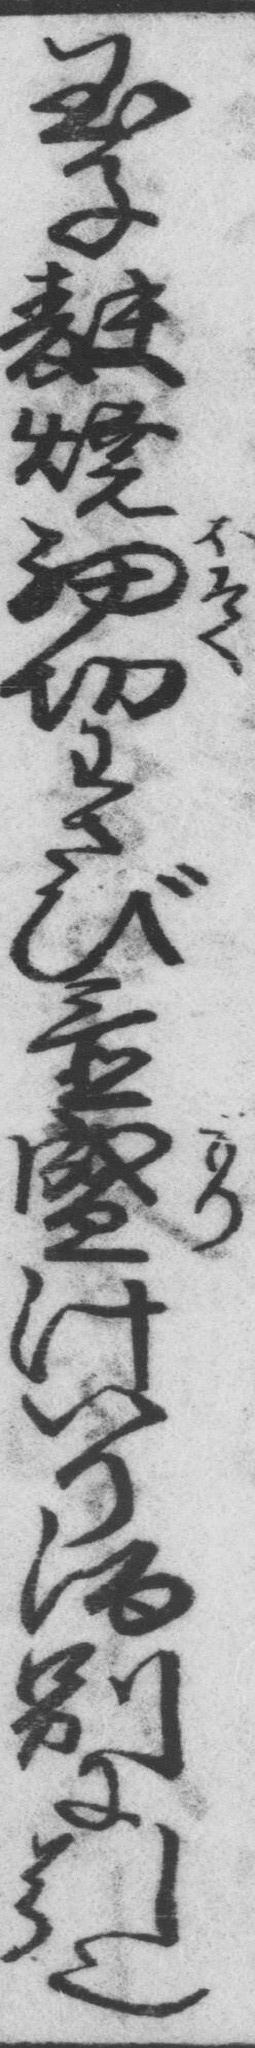玉子麩焼細切わさび置盛汁いり酒別に引也
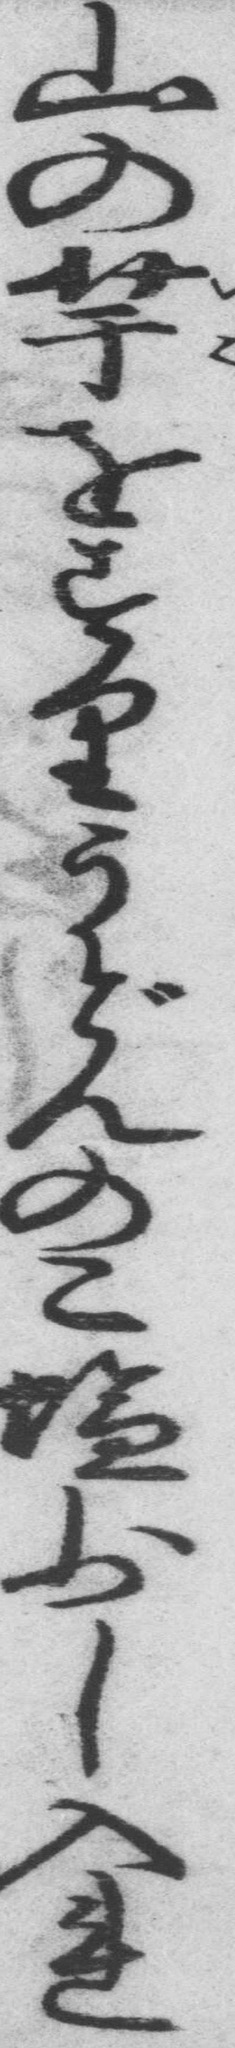山の芋をすりうどんのこ塩少し入れ
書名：料理山海郷
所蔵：大阪府立大学学術情報センター 国文学研究資料館
